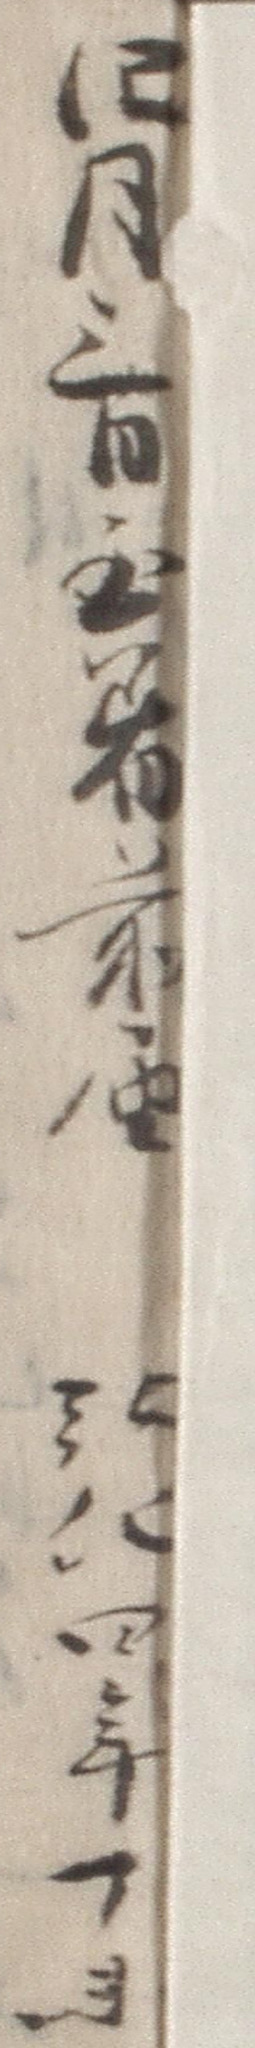四月三日至着前届弘化四年丁未
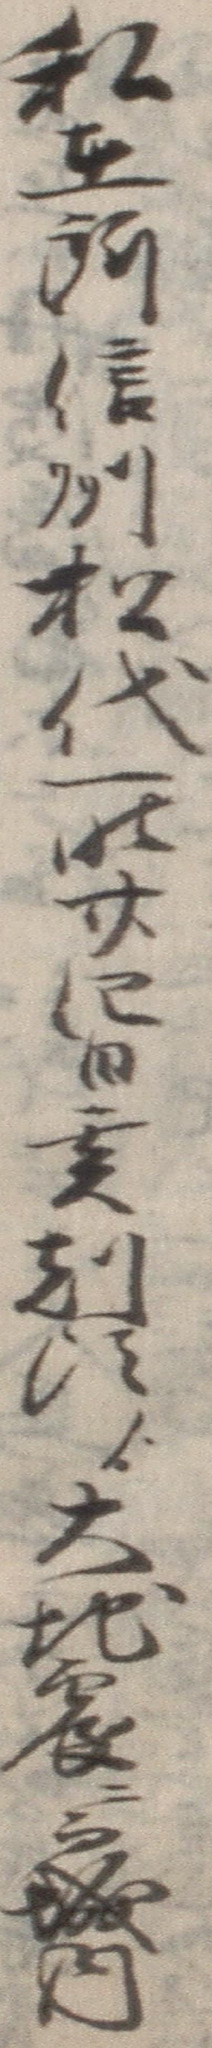私在所信州松代一昨廿四日亥刻頃ゟ大地震ニ而城内
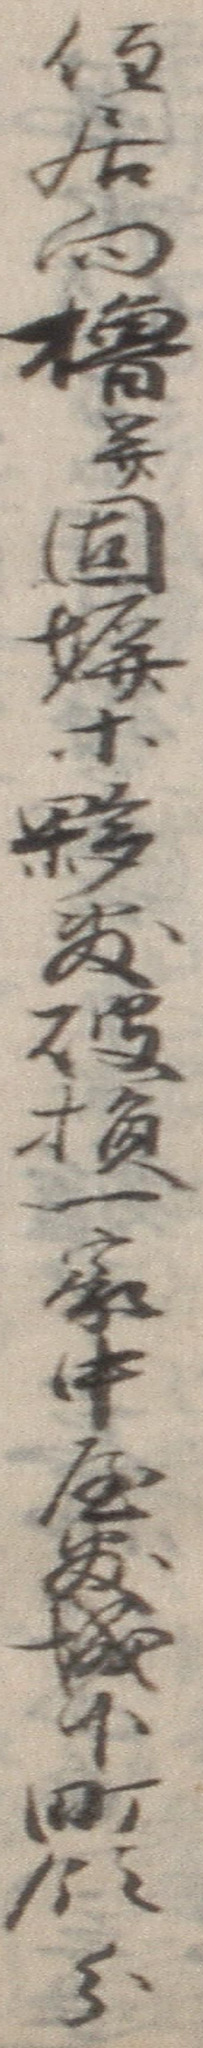住居向櫓并固塀等夥敷破損一家中屋敷城下町領分
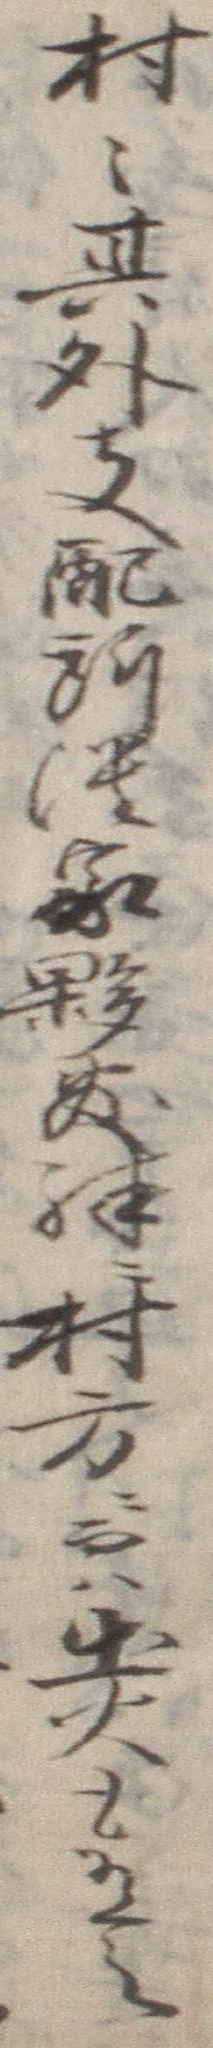村々其外支配所潰家夥敷殊ニ村方ニ而ハ出火も有之
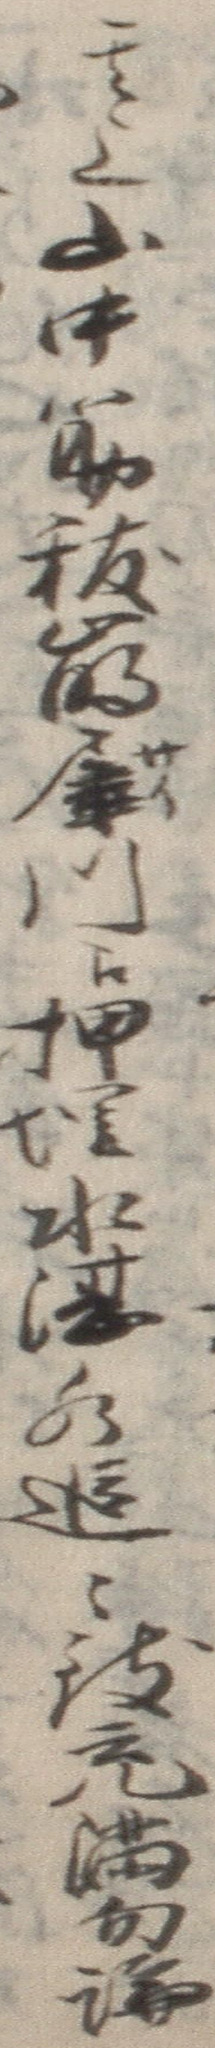其上山中筋抜崩犀川江押埋水湛水追々致充満勿論
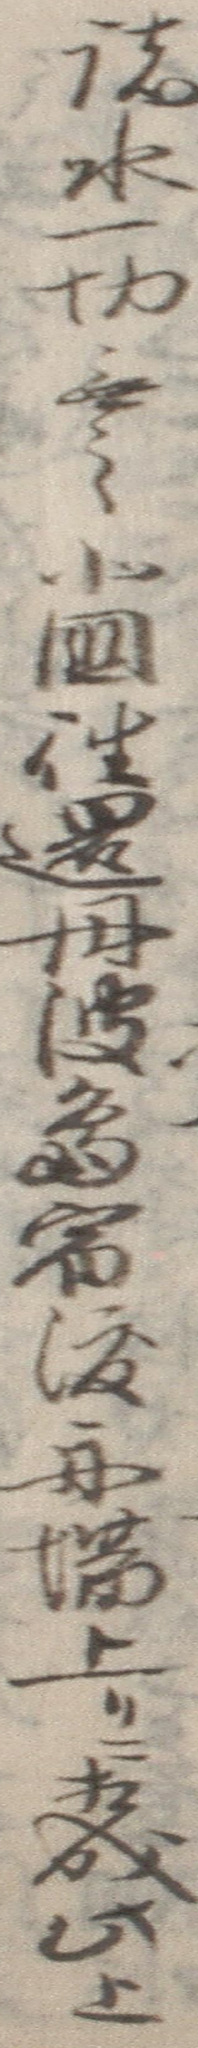諸水一切無之北国往還丹波島宿渡舟場上りニ相成此上
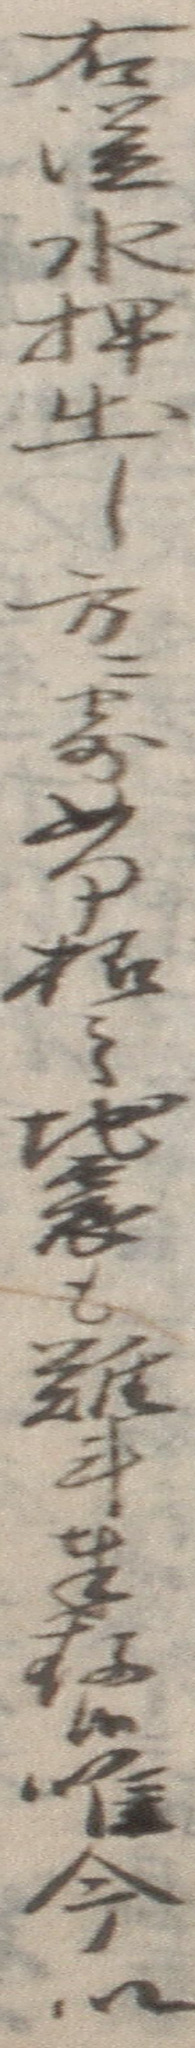右溢水押出し方ニ寄如何様之地震も難計奉存候唯今以
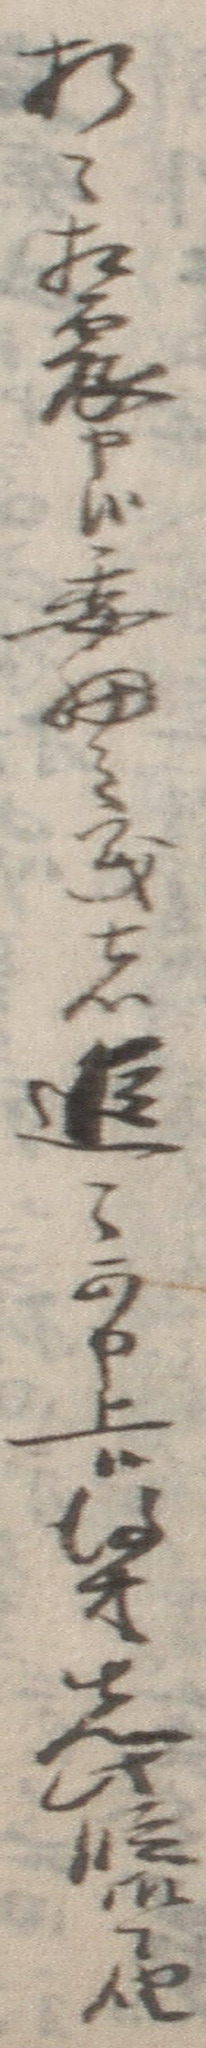折々相震申候委細之義者追々可申上候得共先此段御届
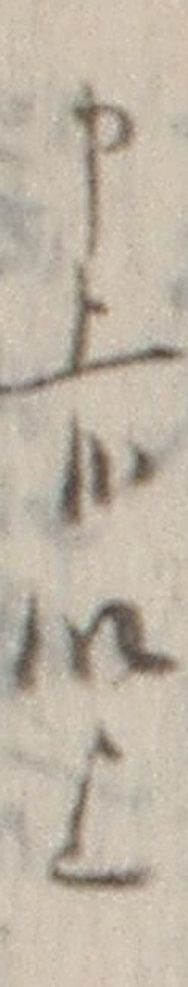申上候以上
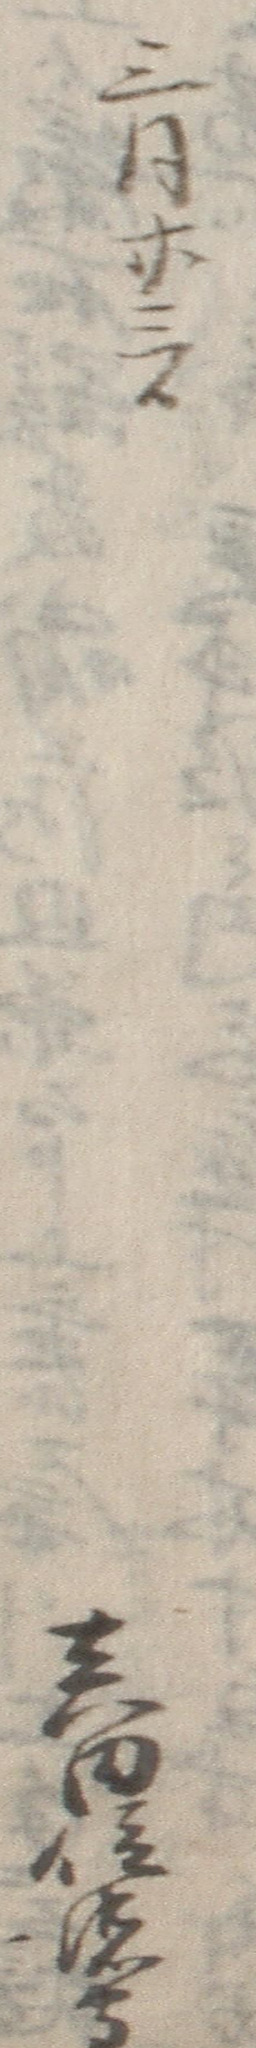三月廿三日真田信濃守
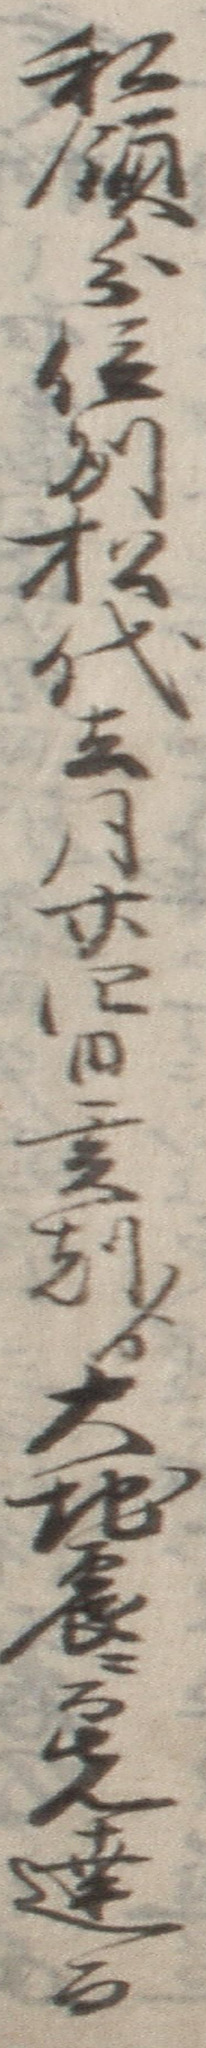私領分信州松代去月廿四日亥刻ゟ大地震ニ而先達而
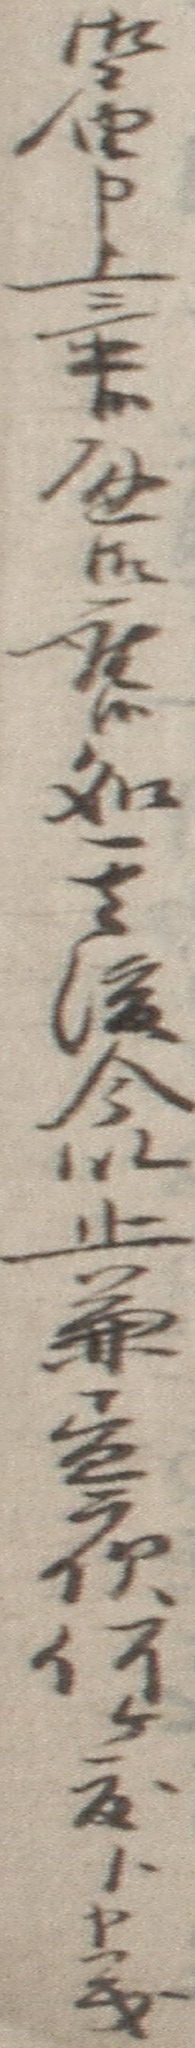御届申上シ書候通御座候処其後今以止兼昼夜何ヶ度ト申義

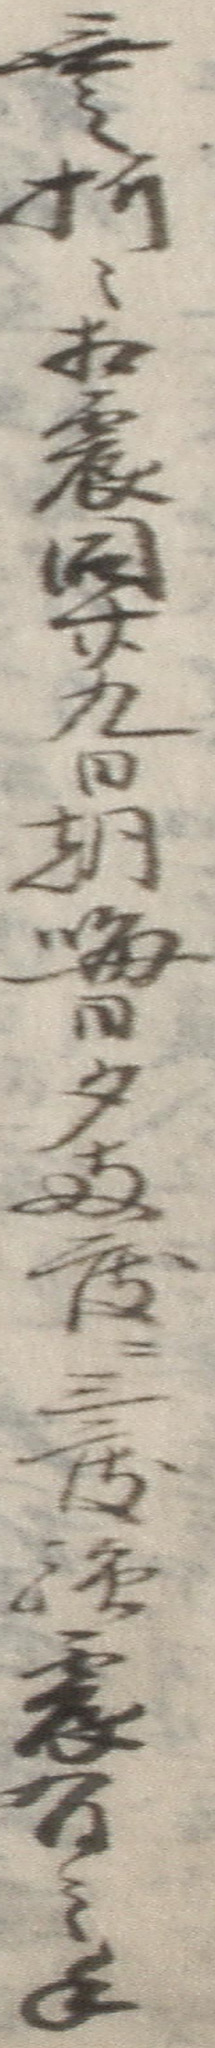無之折々相震同廿九日朝晦日夕両度ニ三度強震有之手
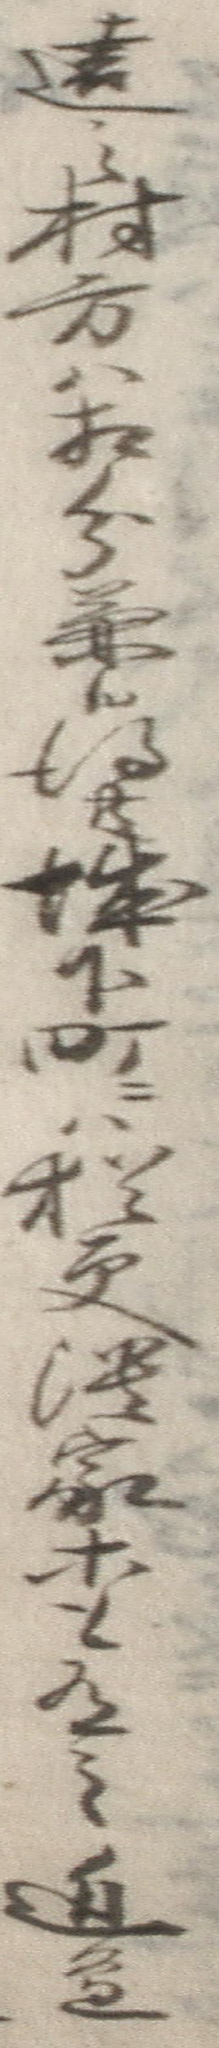遠之村方ハ相分兼候得共城下町二ハ猶更潰家等も有之近辺
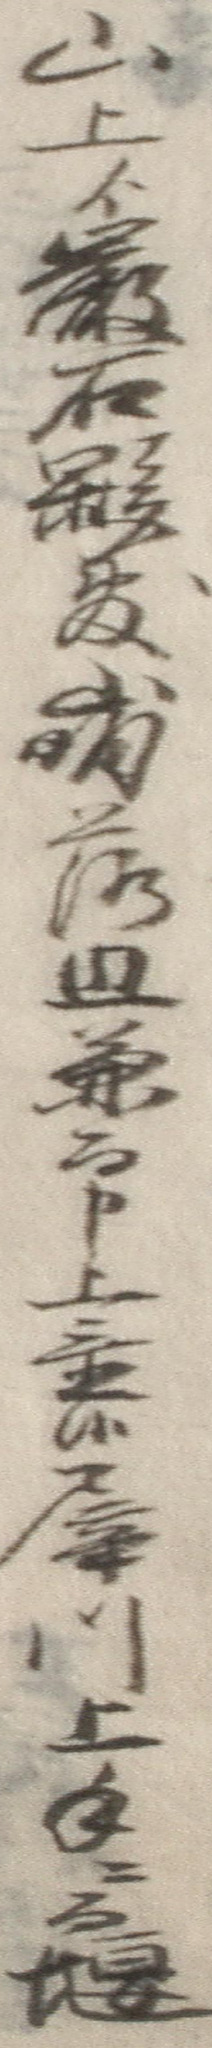山上ゟ巌石夥敷崩落且兼而申上置候犀川上手ニ而堰
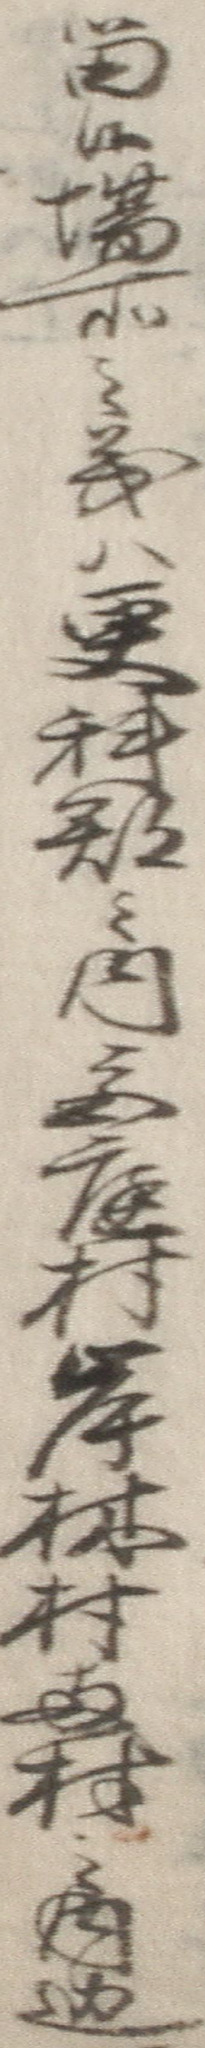留候場所之義ハ更科郡之内宮庭村岸林村両村之内辺ニ
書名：[善光寺地震に関する冊子]
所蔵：東京大学地震研究所図書室 Earthquake Research Institute Library, The University of Tokyo, JAPAN
